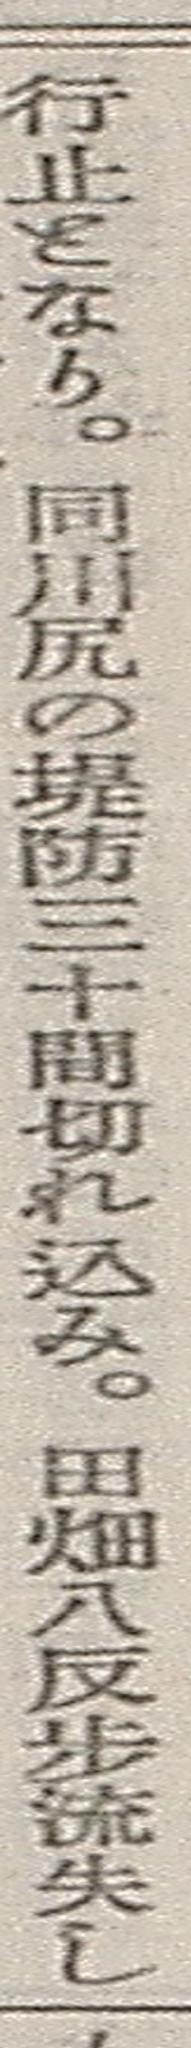行止となり。同川尻の堤防三十間切れ込み。田畑八反歩流失し
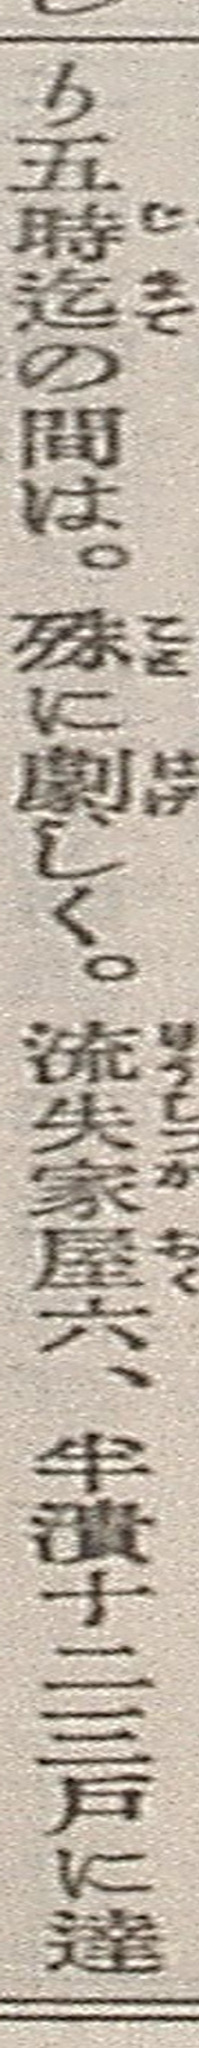り五時迄の間は。殊に劇しく。流失家屋六、半潰十二三戸に達
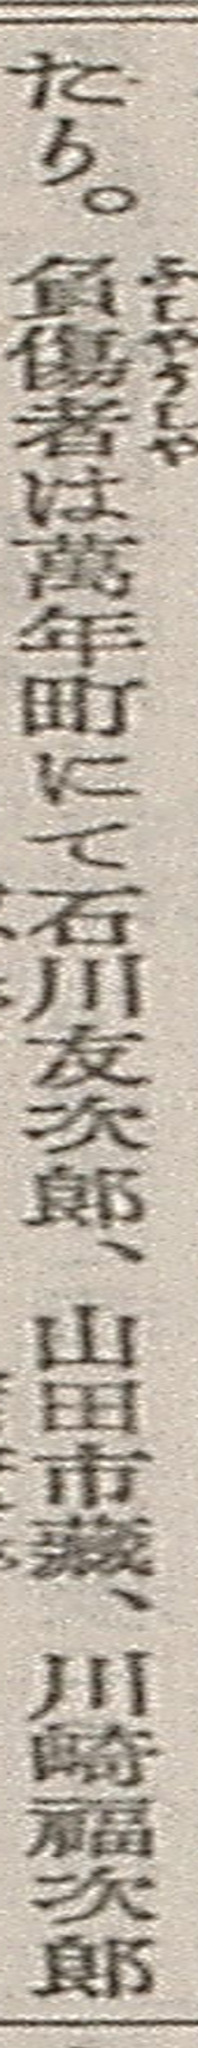たり。負傷者は万年町にて石川友次郎、山田市蔵、川崎福次郎
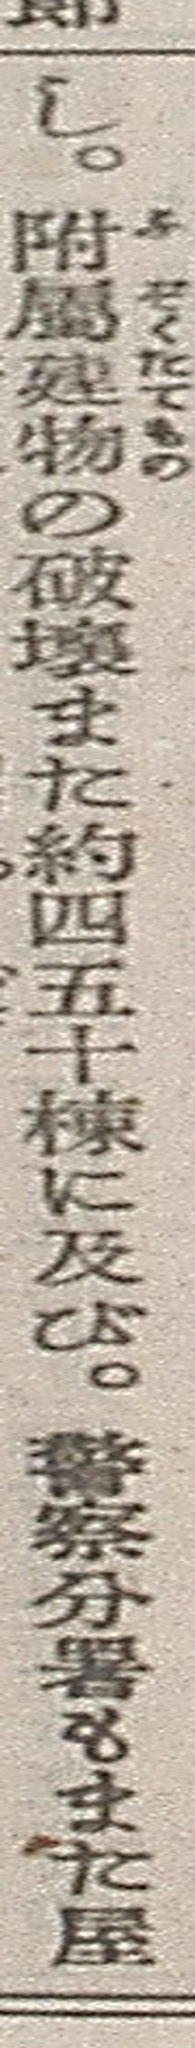し。附属建物の破壊また約四五十棟に及び。警察分署もまた屋
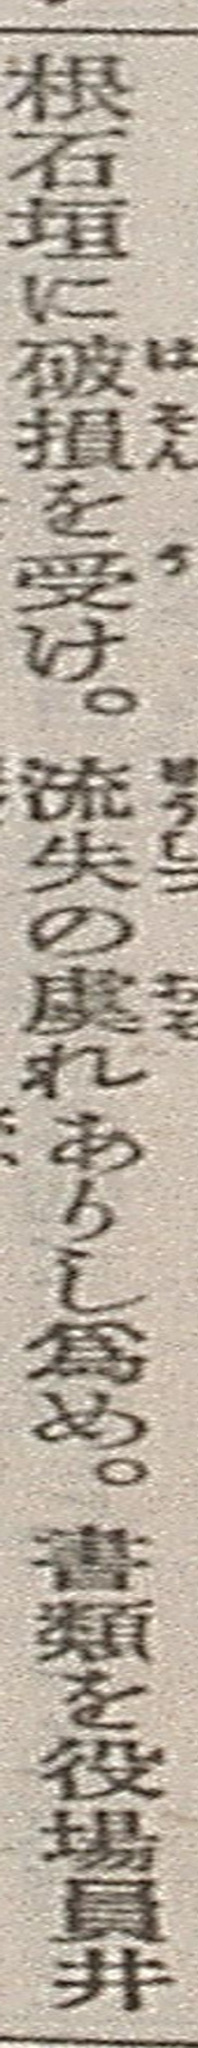根石垣に破損を受け。流失の虞れありし為め。書類を役場員井
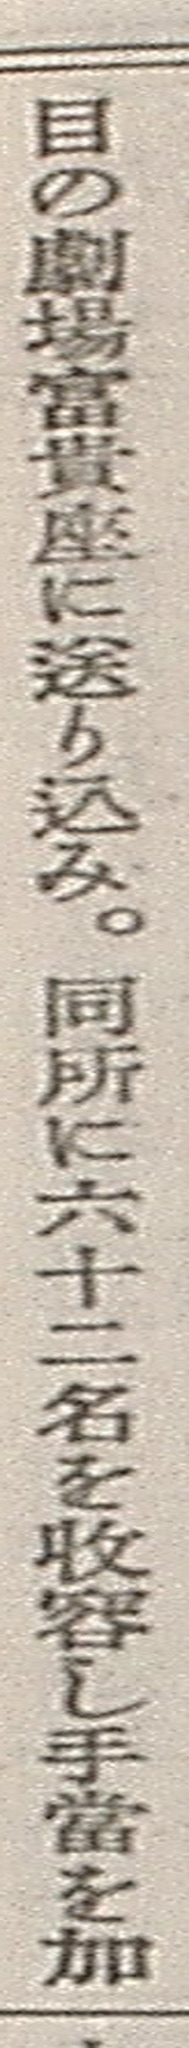目の劇場富貴座に送り込み。同所に六十二名を収容し手当を加
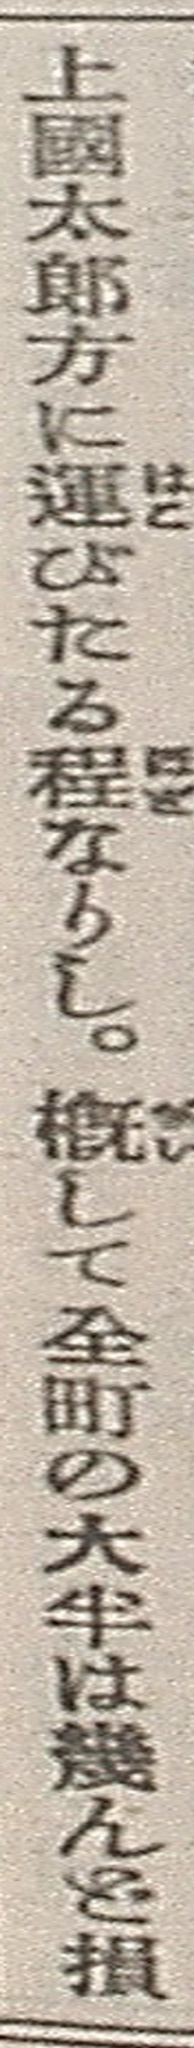上国太郎方に運びたる程なりし。概して全町の大半は幾んど損

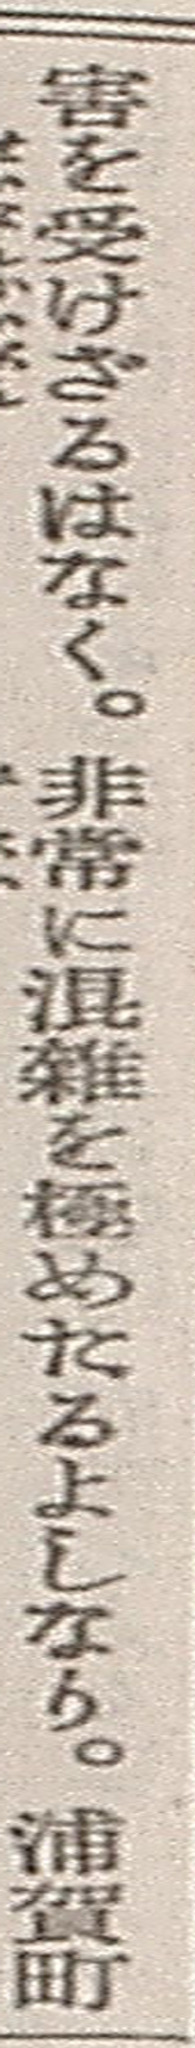害を受けざるはなく。非常に混雑を極めたるよしなり。浦賀町
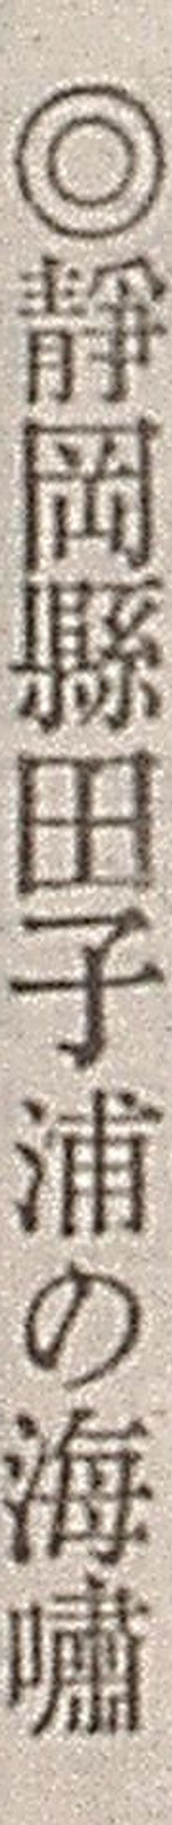◎静岡県田子浦の海嘯
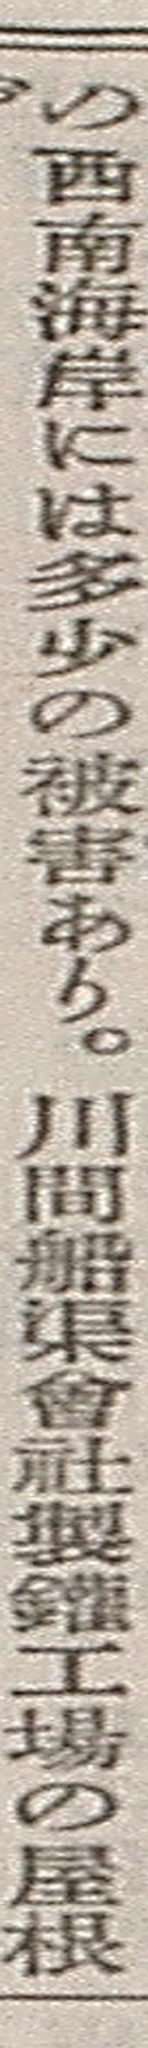の西南海岸には多少の被害あり。川間船渠会社製罐工場の屋根
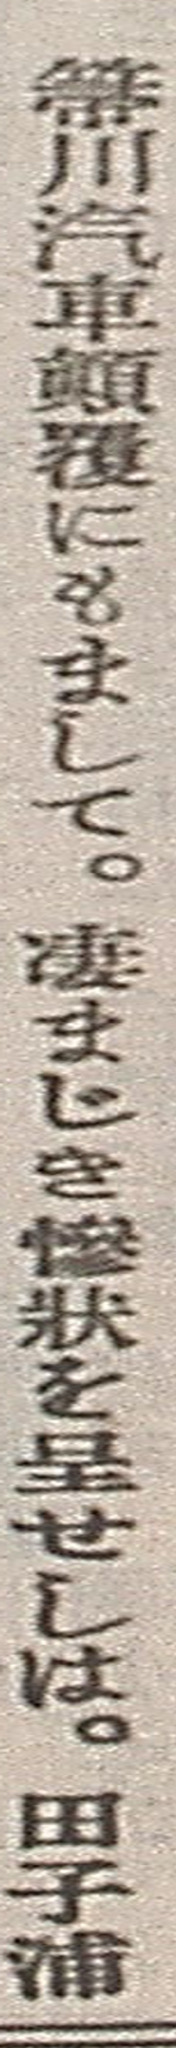箒川汽車顛覆にもまして。凄まじき惨状を呈せしは。田子浦
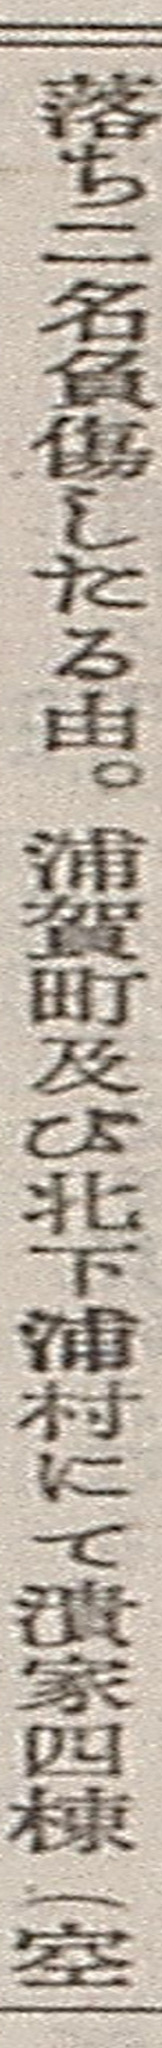落ち二名負傷したる由。浦賀町及び北下浦町にて潰家四棟（空
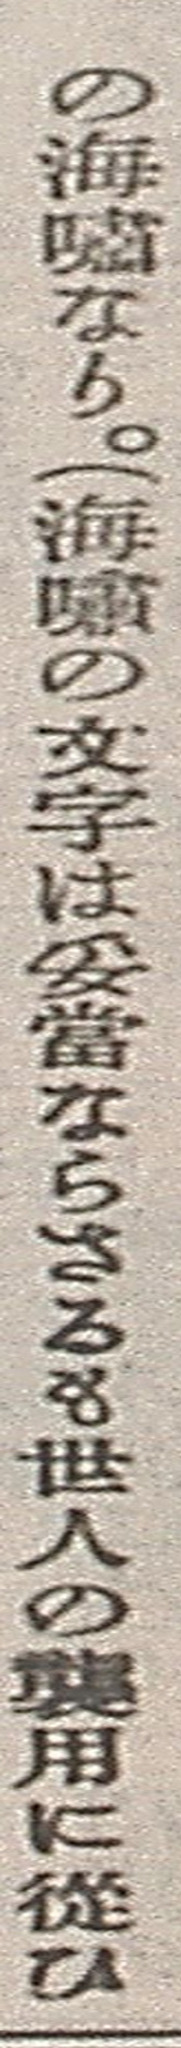の海嘯なり。（海嘯の文字は妥当ならさるも世人の襲用に従ひ
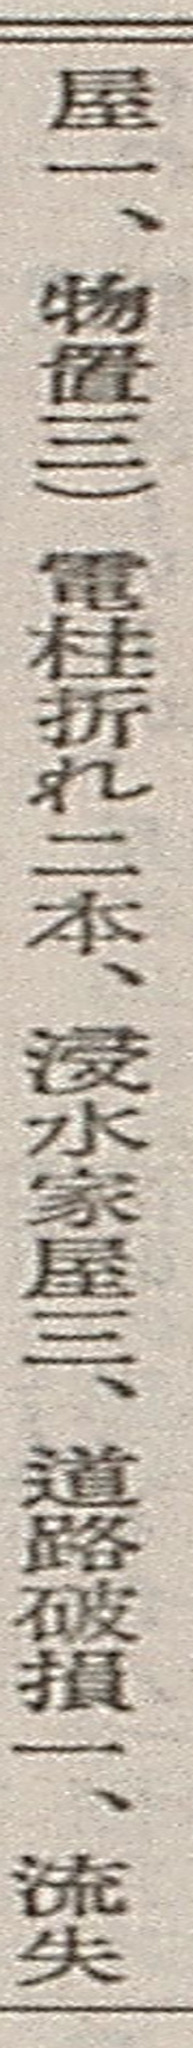屋一、物置三）電柱折れ二本、浸水家屋三、道路破損一、流失
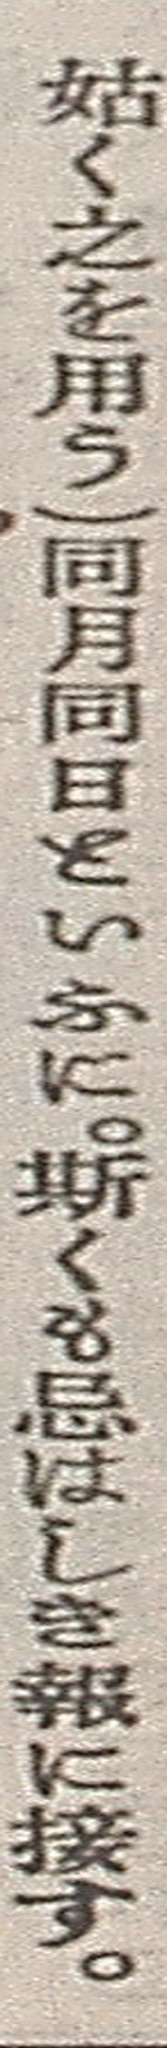姑く之を用う）同月同日といふに。斯くも忌はしき報に接す。
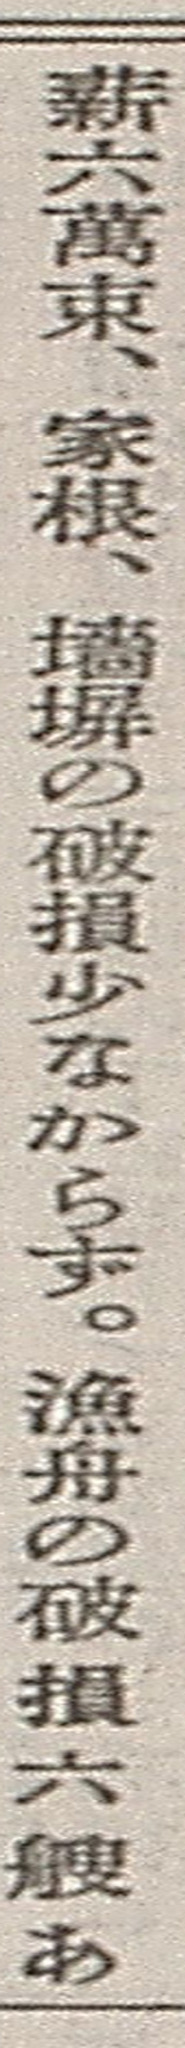薪六万束、家根、墻塀の破損少なからず。漁舟の破損六艘あ
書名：風俗畫報臨時増刊第百九十九號　明治三十二年十月各地災害圖會（前編之續）
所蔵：東京大学地震研究所図書室 Earthquake Research Institute Library, The University of Tokyo, JAPAN
